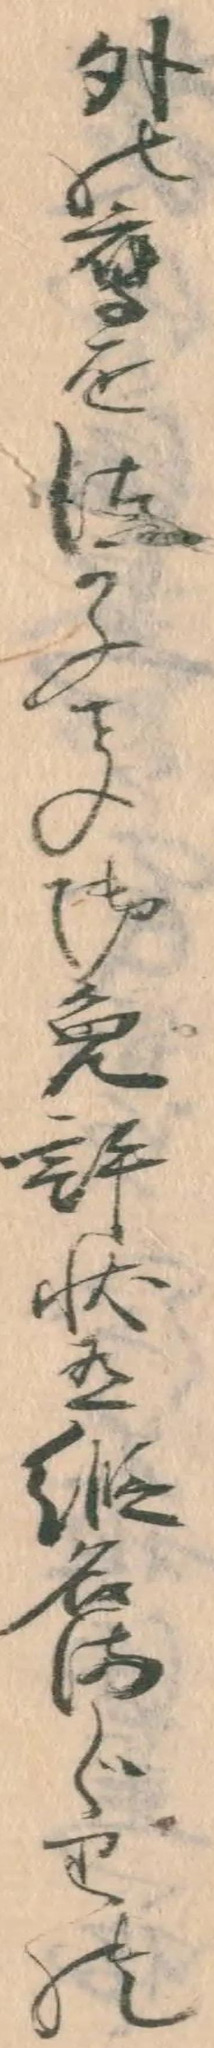外の鷹をつかふことの御免許状有仮名まじりの
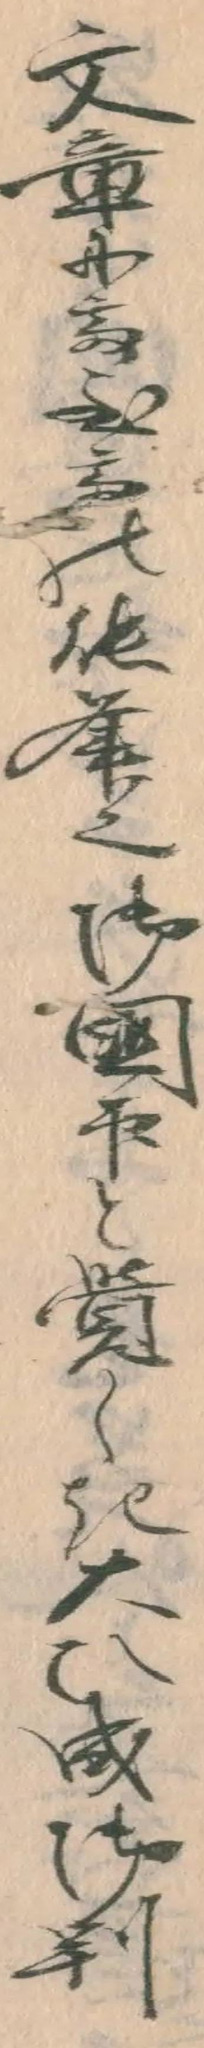文章にて至ての能筆也御国印と覚しき大ひ成御判
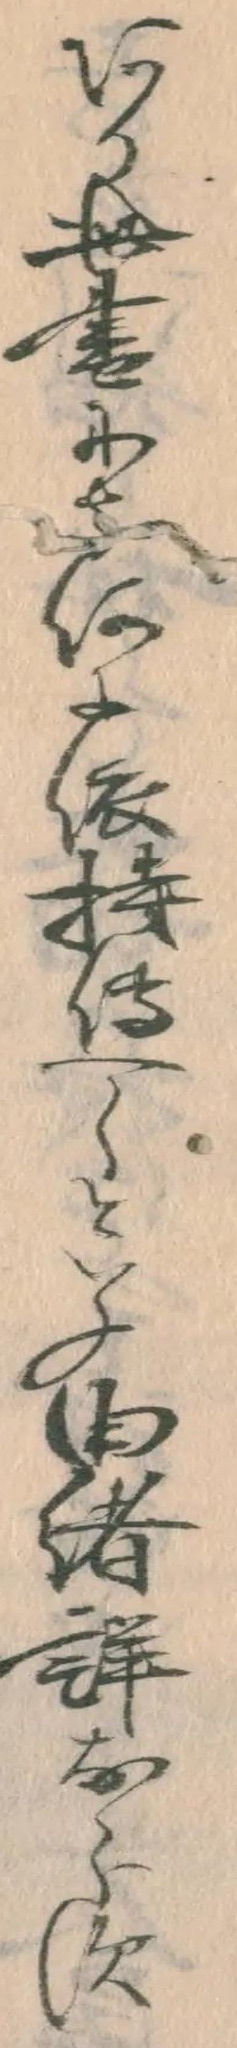あり此書には何に依持伝へしといふ由緒詳ならす
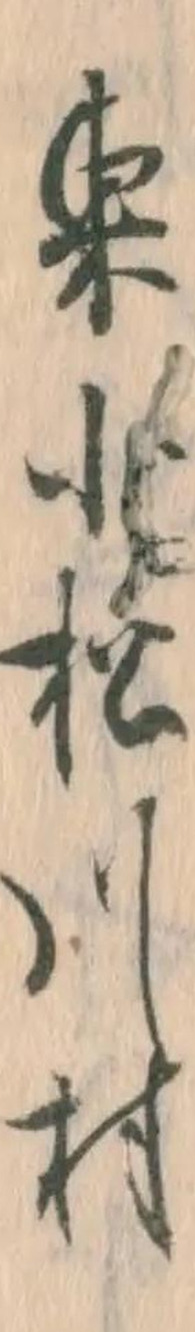東北松川村
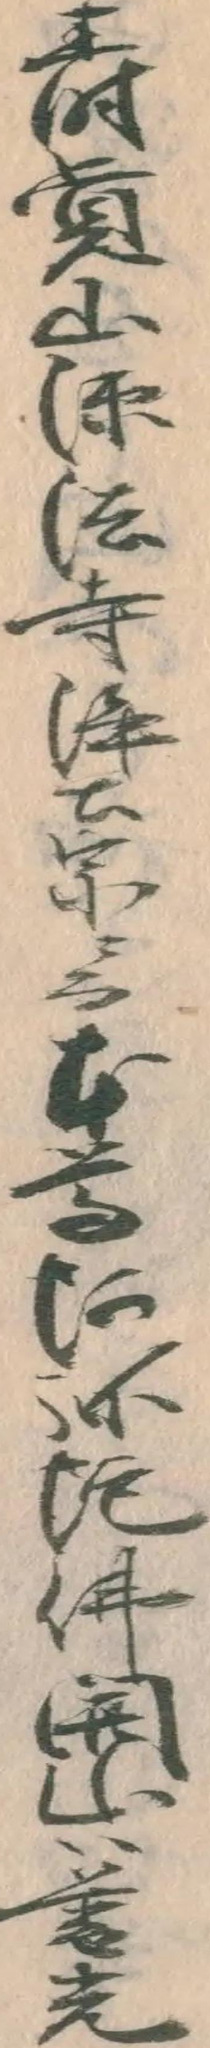寿覚山源法寺浄土宗にて本尊阿弥陀仏開山は普光
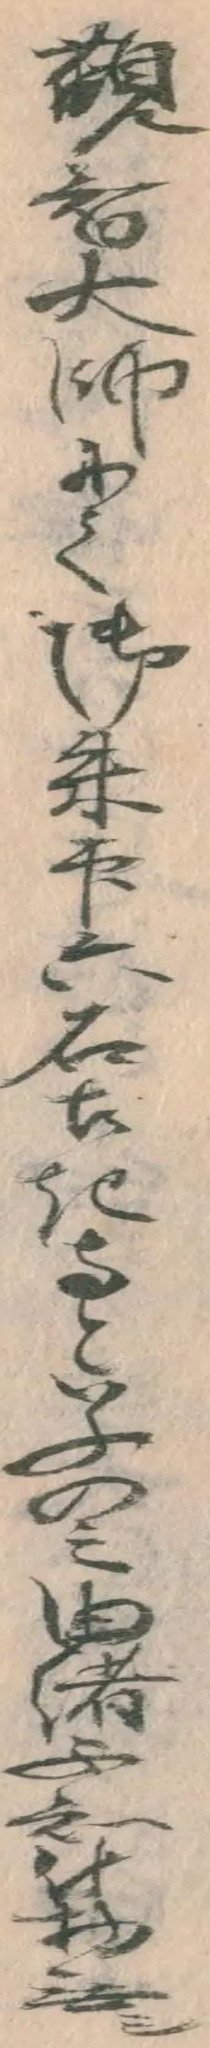観智大師にて御朱印六石古き寺といふのみ由偖不知什物無し
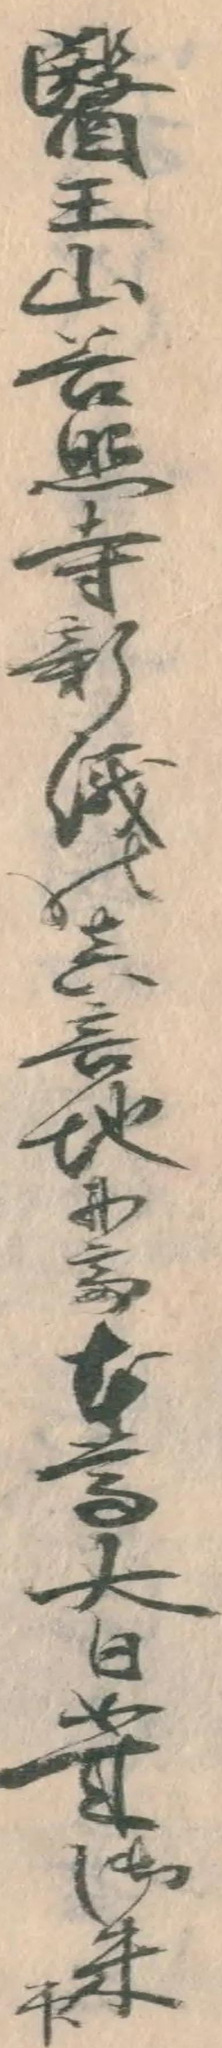医王山善照寺新儀の真言地にて本尊大日如来御朱印
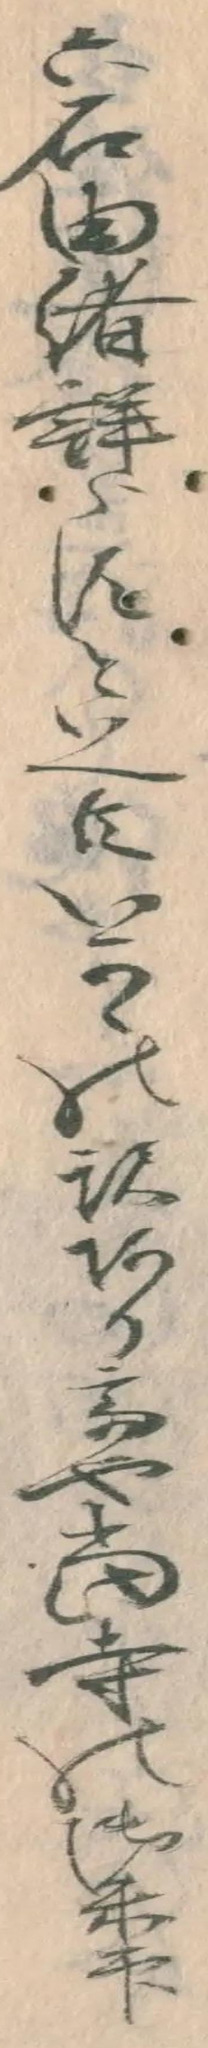六石由緒弁小臣といへ共いかゝの訳あり高や当寺の御朱印
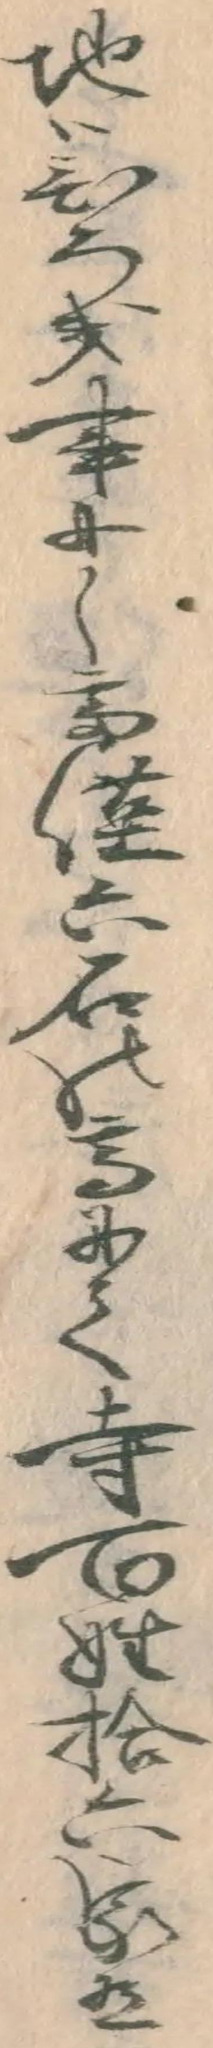地はひろき事にして僅六石の高にて寺百姓拾六家有

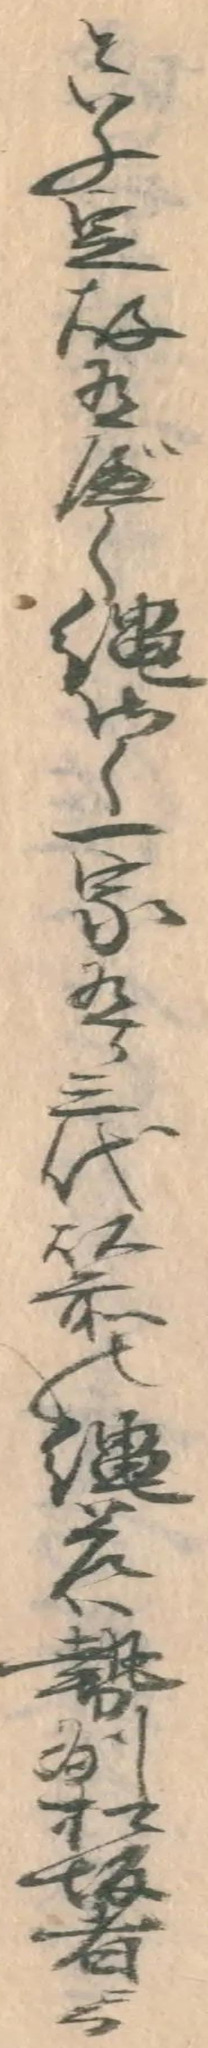といふ定故有べし縄さし一家有り三代以前の縄差は勢州松坂者にて
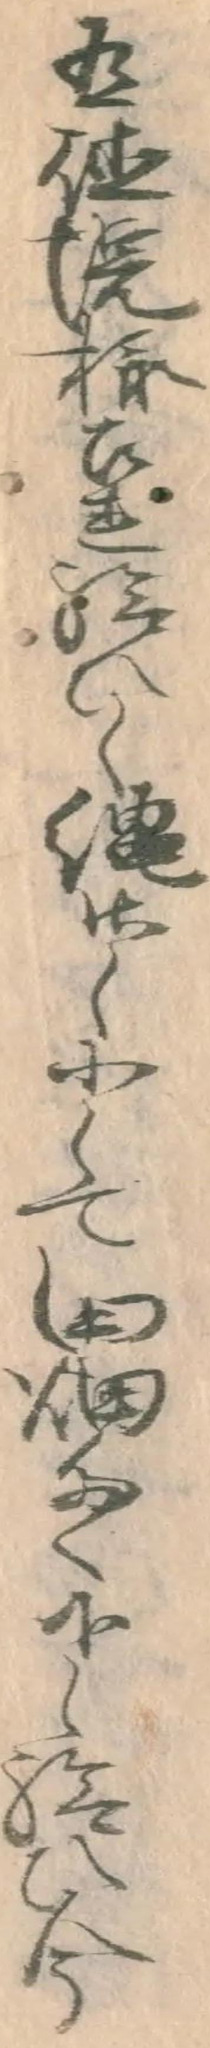有徳院様召れ給ひし縄さしにして田畑多く下し給ひ今
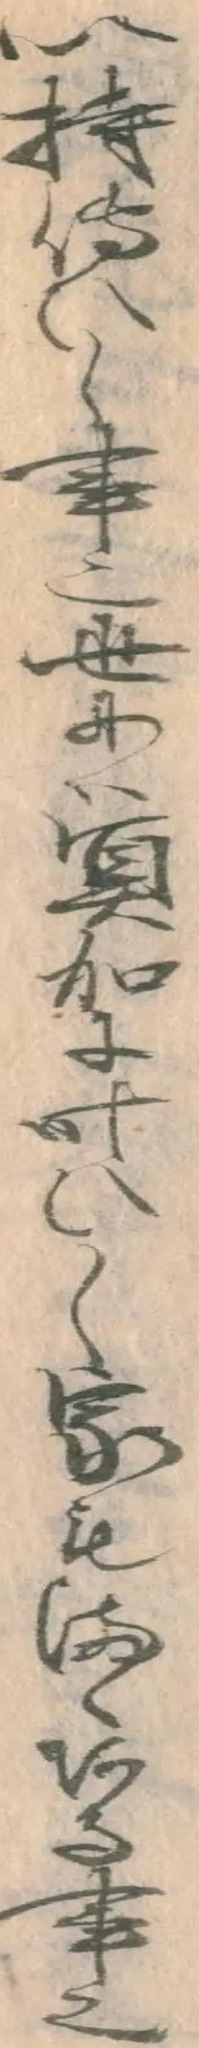以持伝ひし事也世には冥加に叶ひし家もまゝある事也
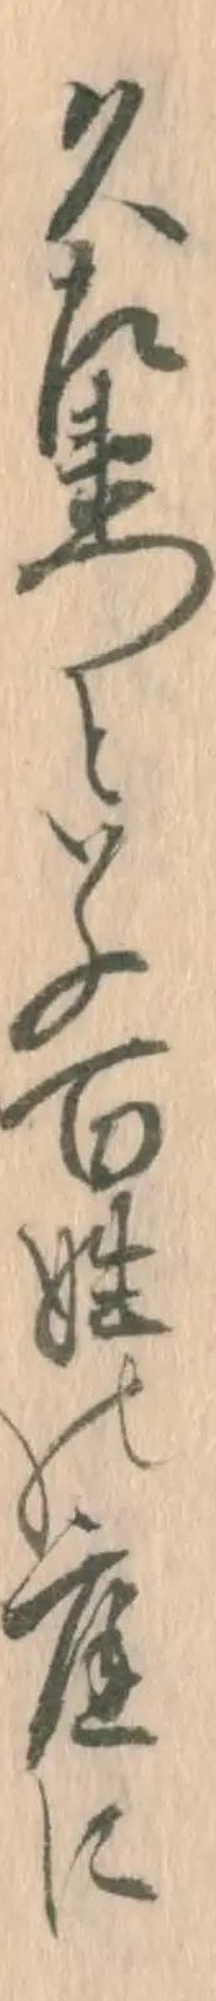久左衛門といふ百姓の庭に
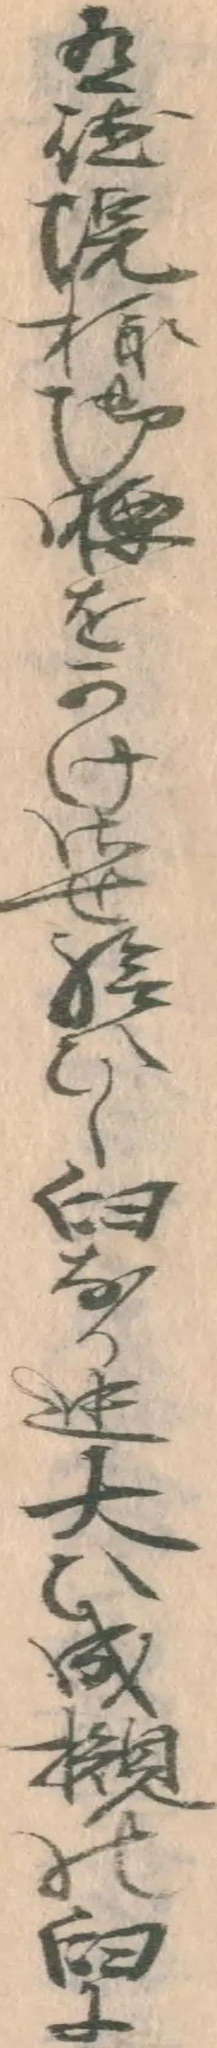有徳院様御腰をかけさせ給ひし臼なる迚大ひ成槻の臼に
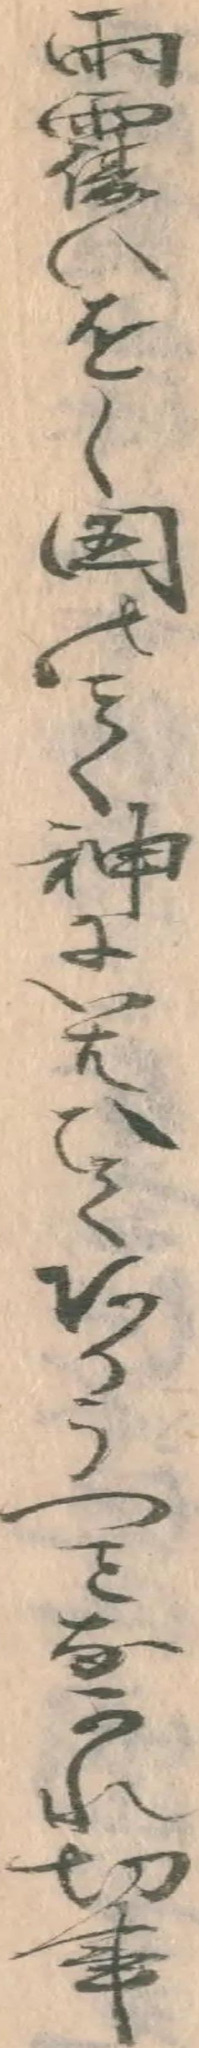雨覆ひをし図のことく神にいはひてありうつことなかれ切事
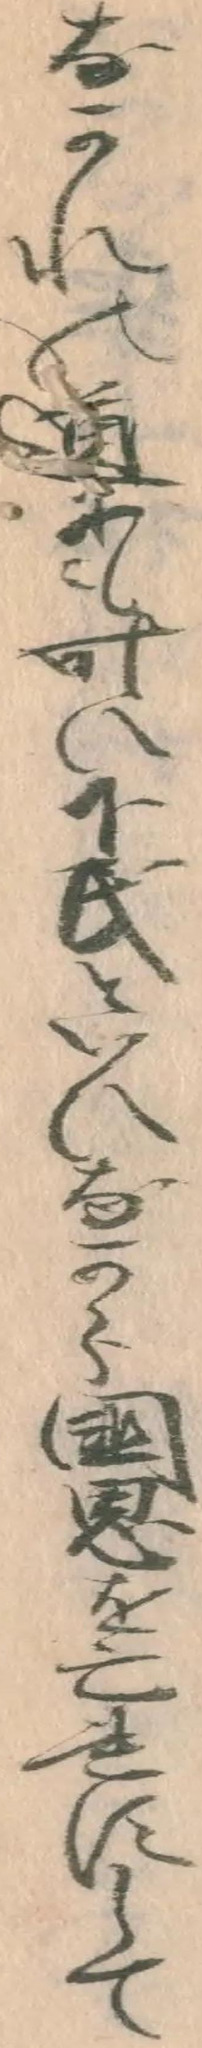なかれの道にも叶ひ下民といひなから国恩を亡れすして
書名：四神地名録 6巻. [4]葛飾郡
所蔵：国立国会図書館 National Diet Library, JAPAN
